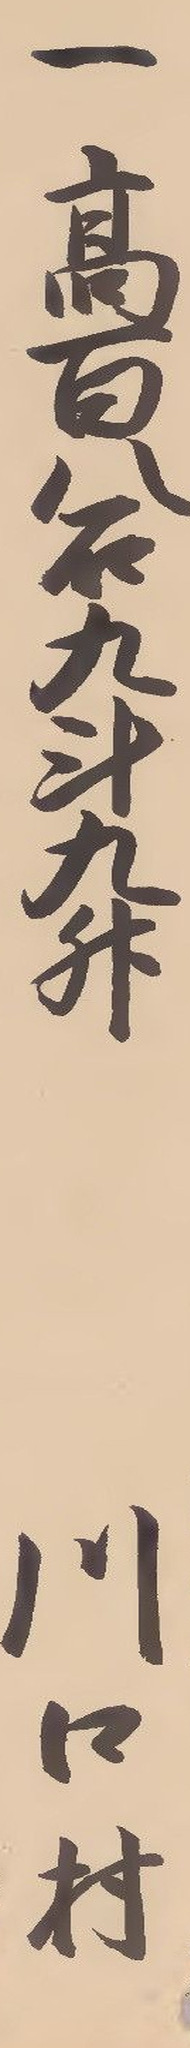一高百八石九斗九升川口村
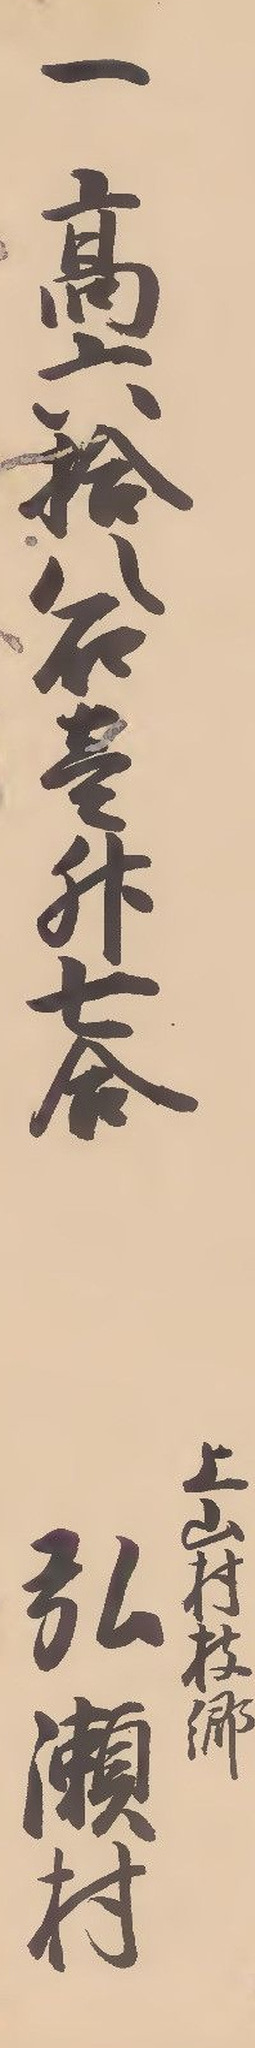一高六拾八石壱升七合弘瀬村

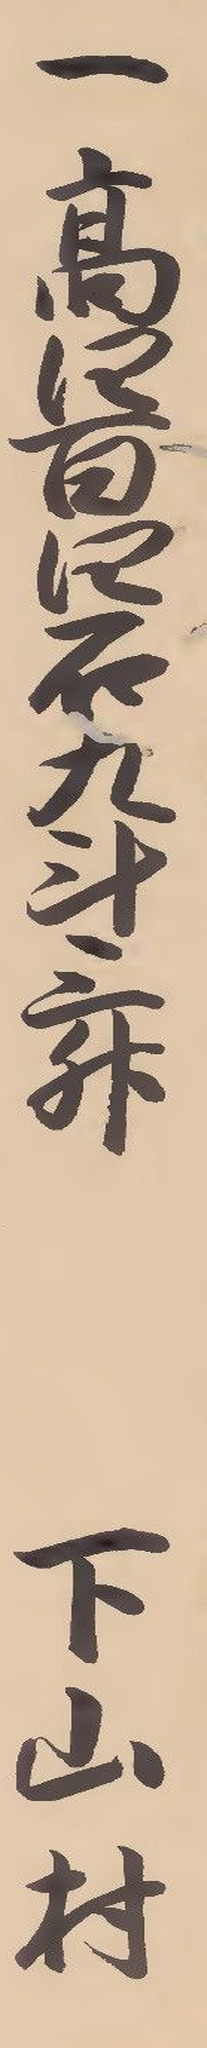一髙四百四石九斗三升下山村
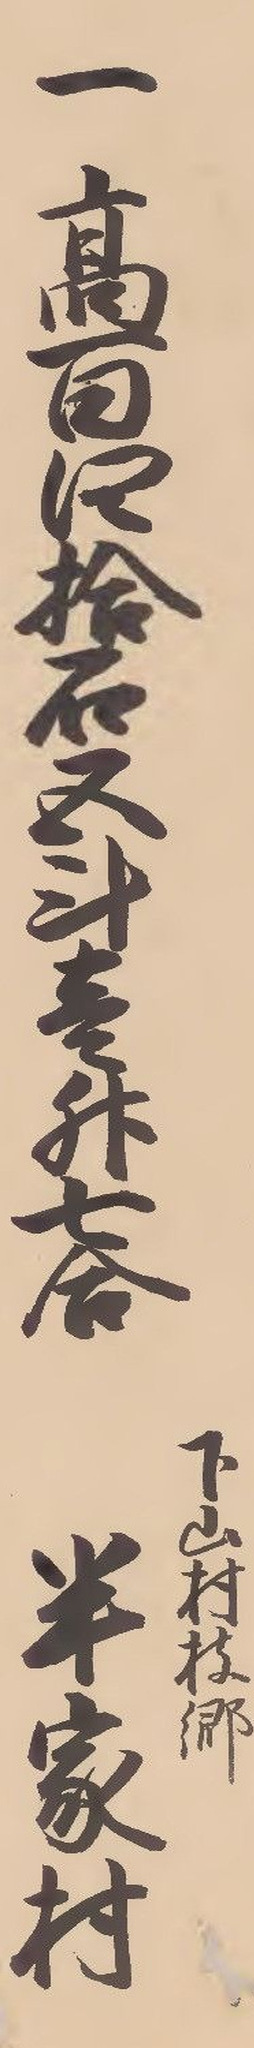一髙百四拾石五斗壱升七合半家村
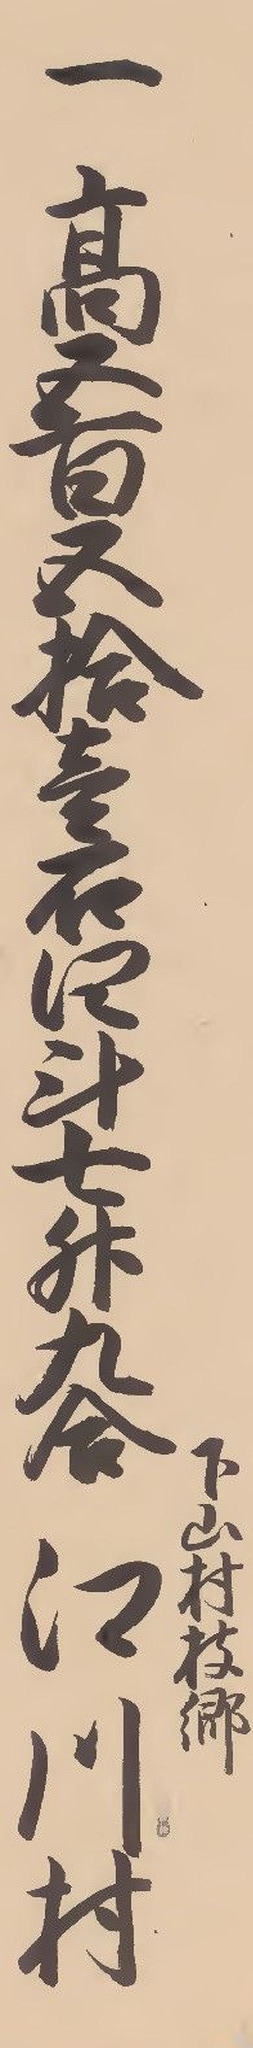一髙五百五拾壱石四斗七升九合江川村
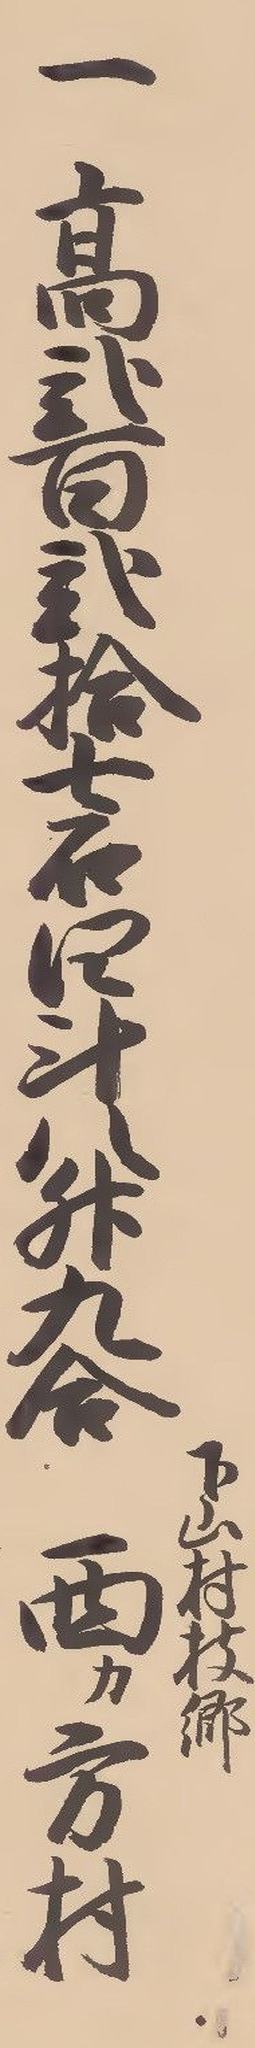一髙弐百弐拾七石四斗八石九合西カ方村
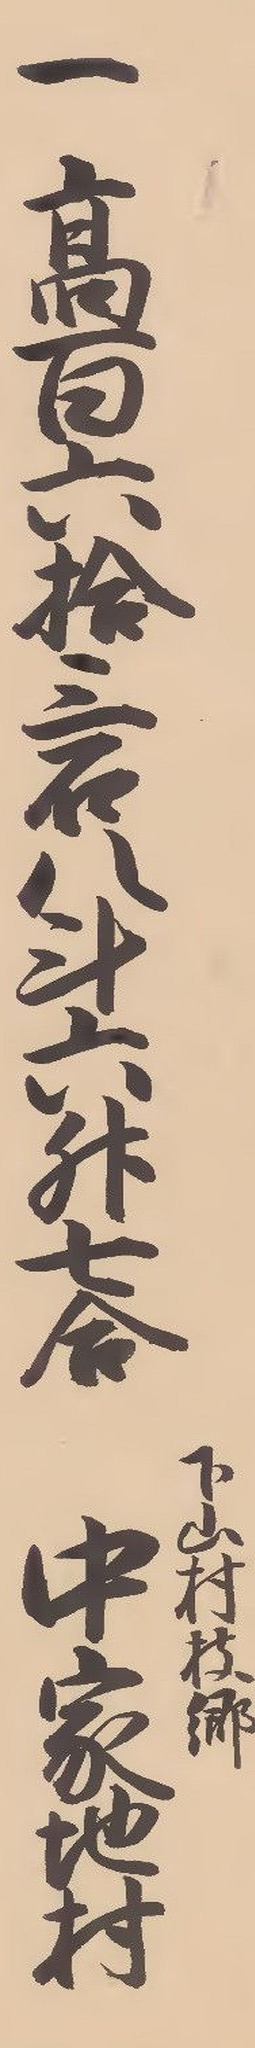一髙百六拾三石八斗六升七合中家地村
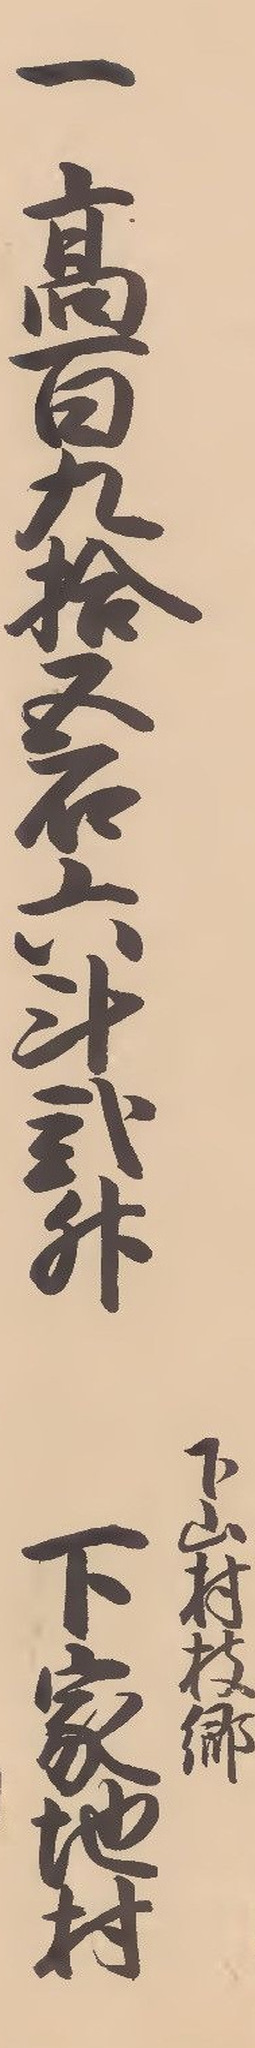一髙百九拾五石六斗弐升下家地村
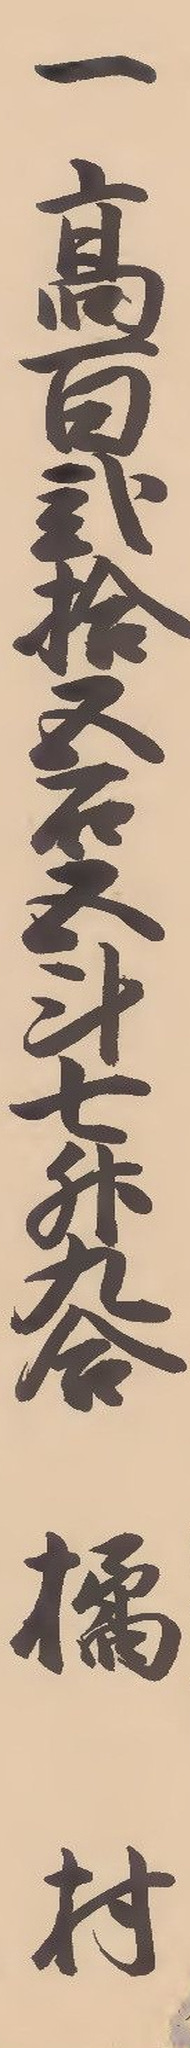一髙百弐拾五石五斗七升九合橘村
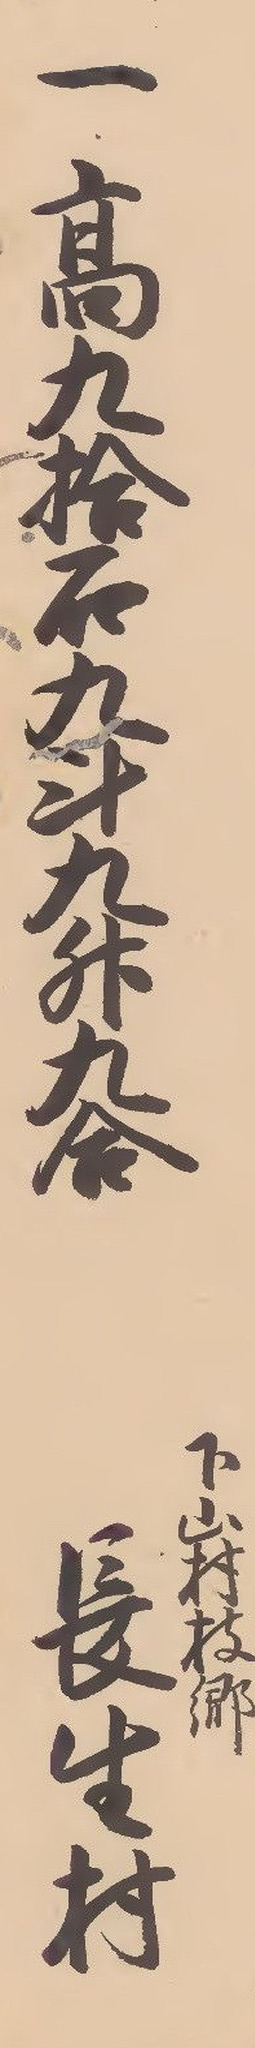一髙九拾石九斗九升九合長生村

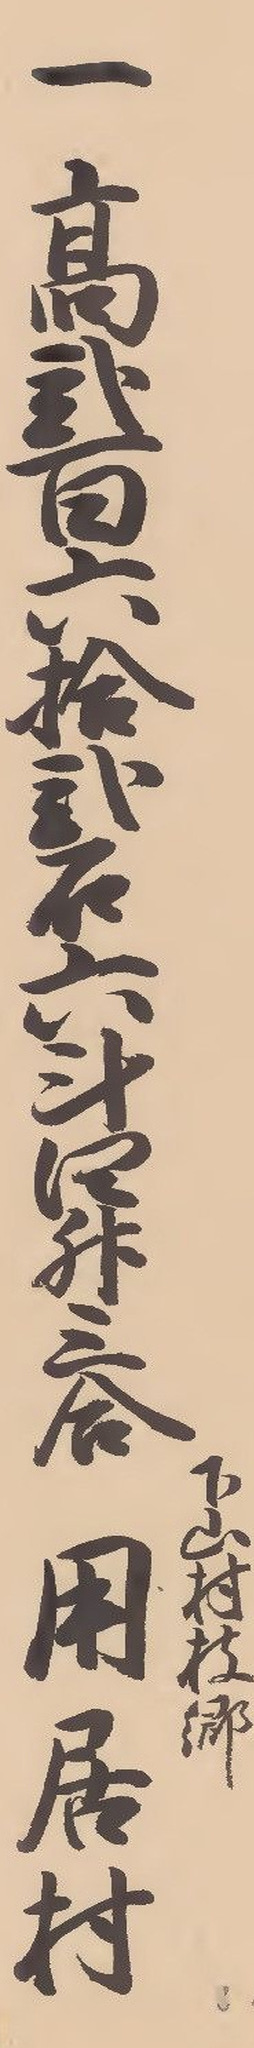一髙弐百六拾弐石六斗四升三合用居村
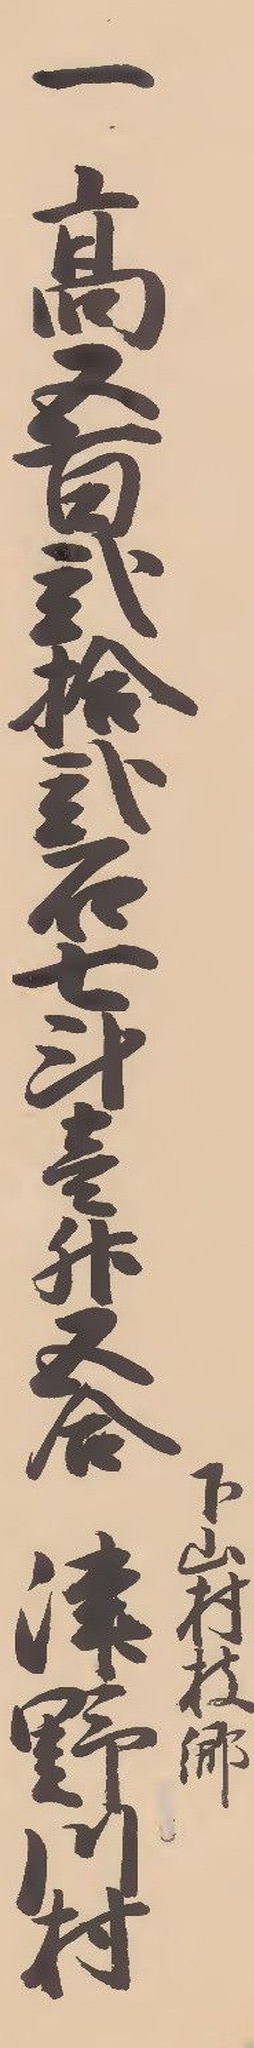一髙五百弐拾弐石七斗壱升五合津野川村
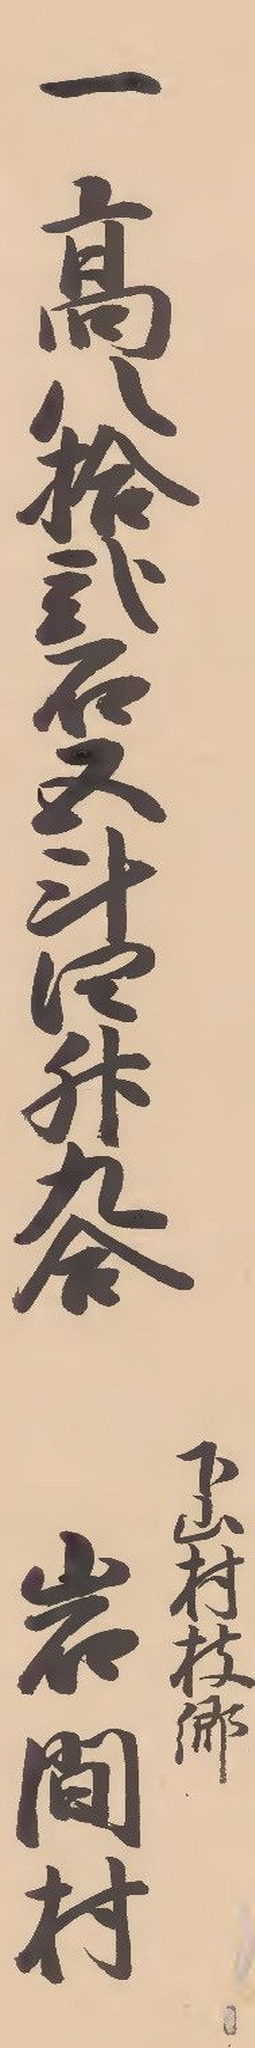一髙八拾弐石五斗四升九合岩間村
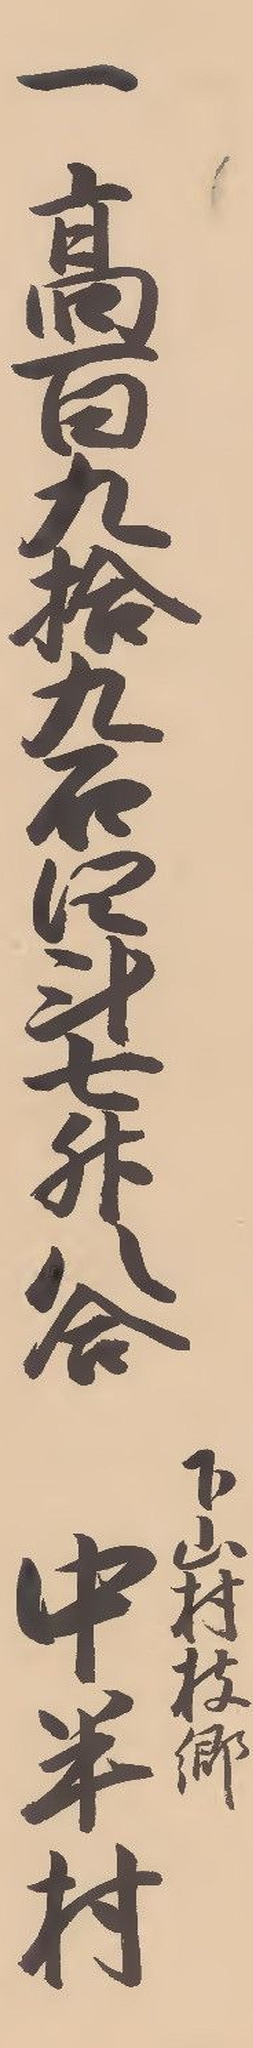一髙百九拾九石四斗七升八合中半村
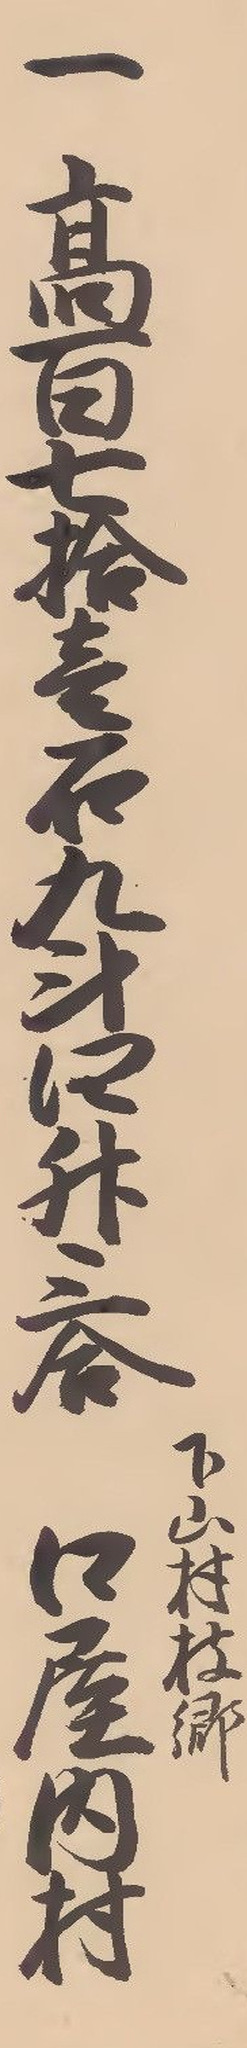一髙百七拾壱石九斗四升三合口屋内村
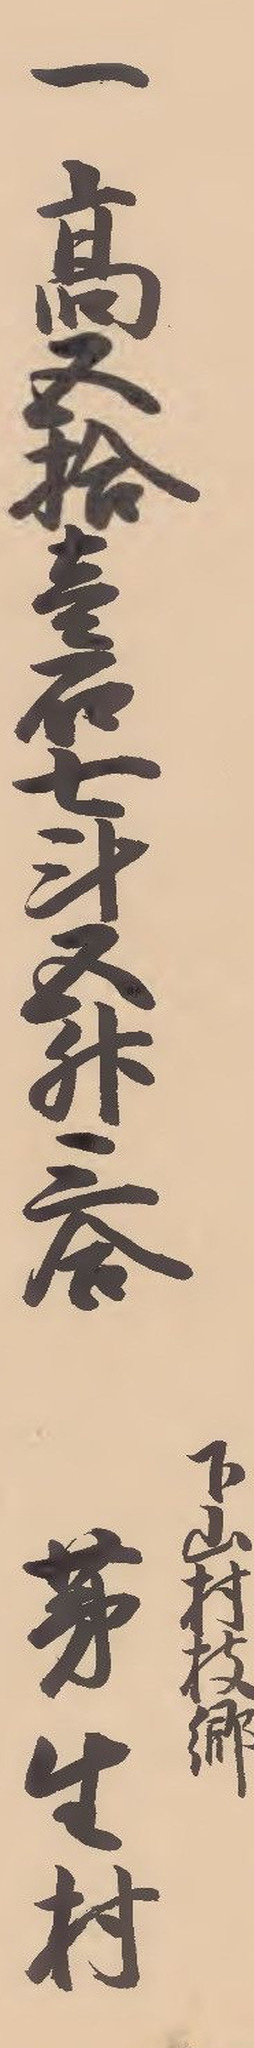一髙五拾壱石七斗五升三合茅生村
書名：土佐国郷帳
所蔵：国立公文書館 National Archives of Japan
